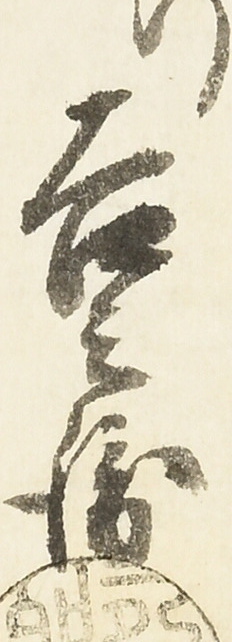吉兵衛
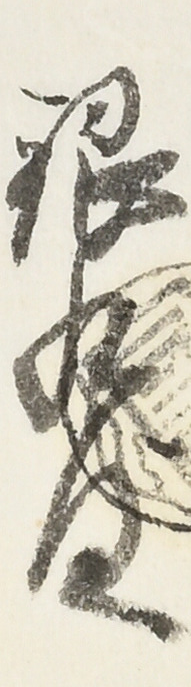銀九匁
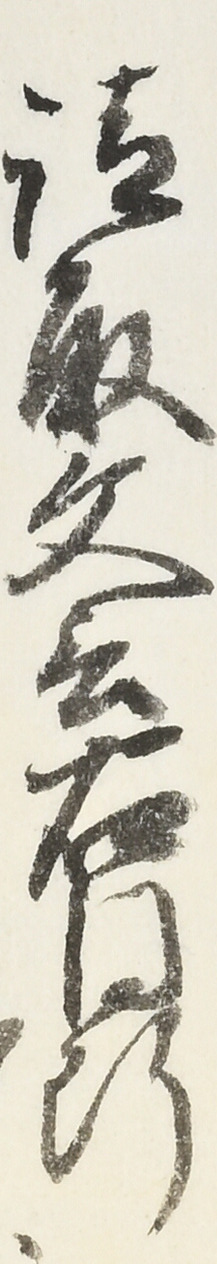請取文言右同断
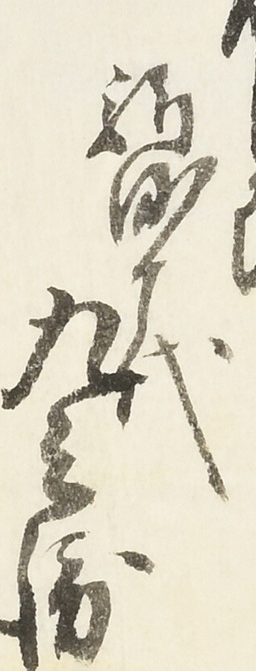寅九兵衛
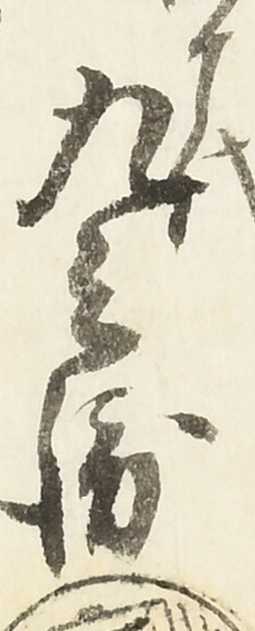寅九兵衛

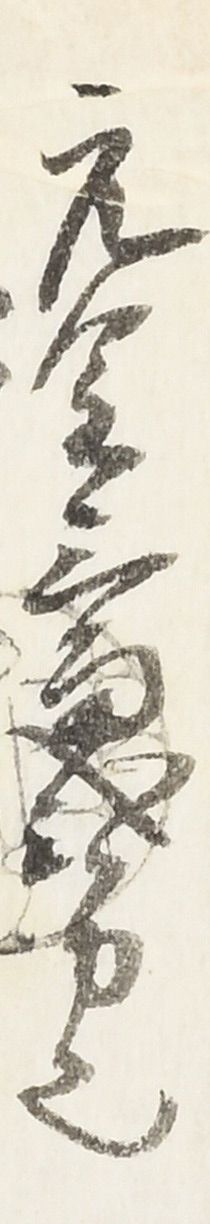元金三両弐分也
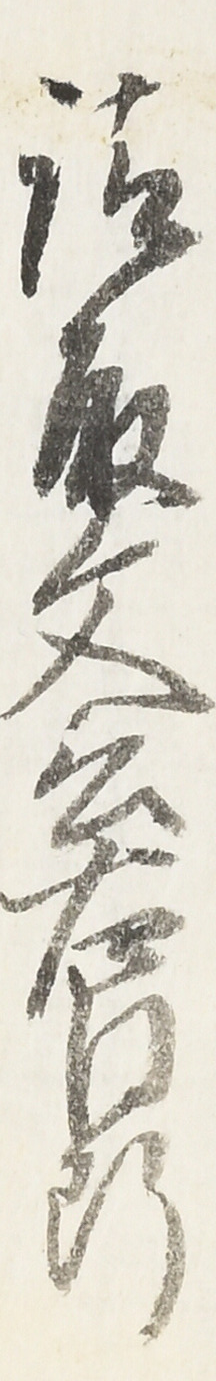請取文言右同断
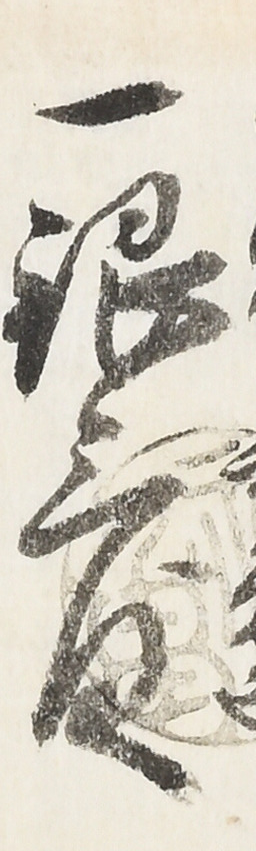一銀三匁
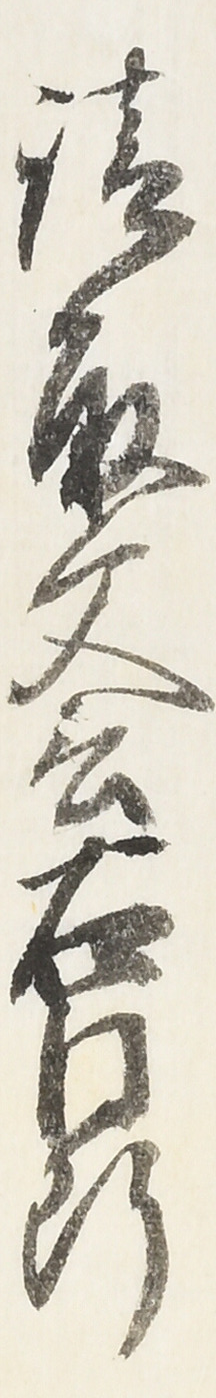請取文言右同断
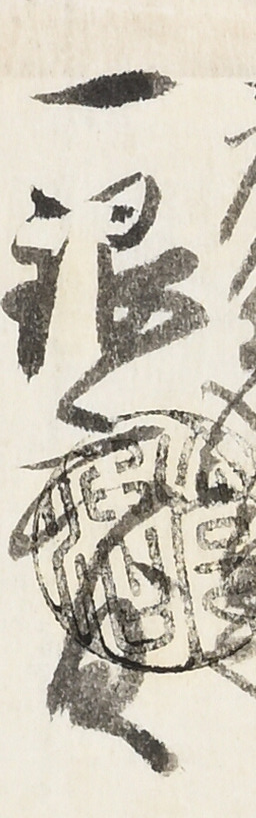一銀六匁
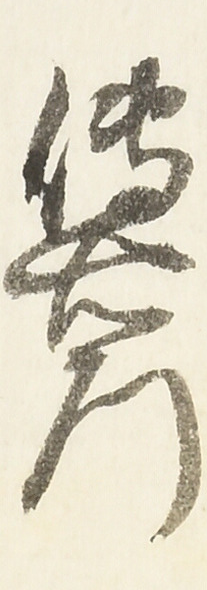伝右衛門
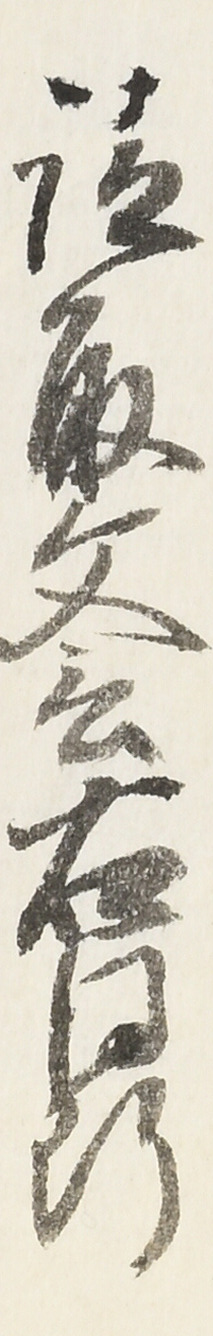請取文言右同断
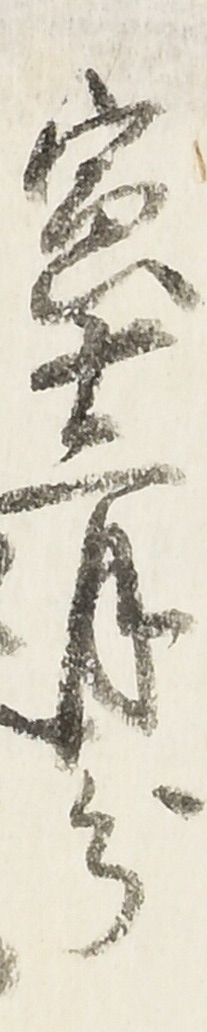寅十二月ゟ
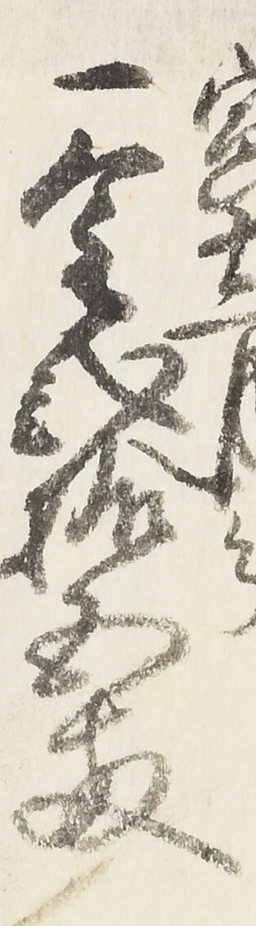一金弐拾五両
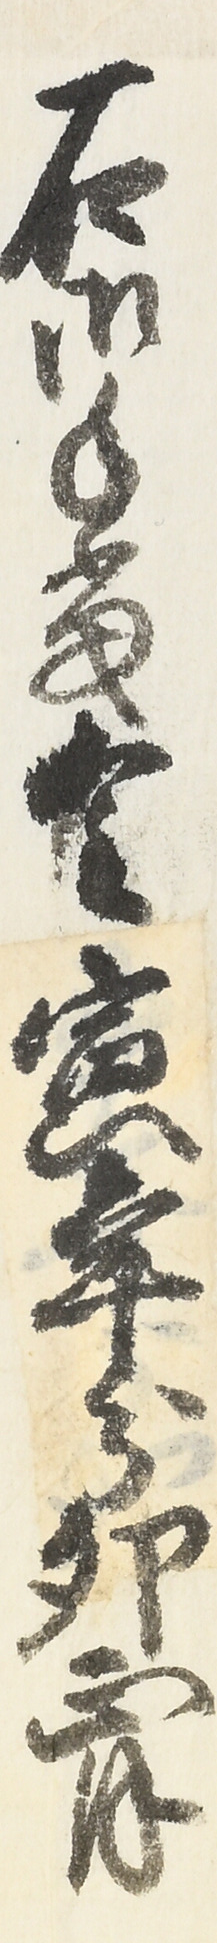右御手当金寅年分卯正月
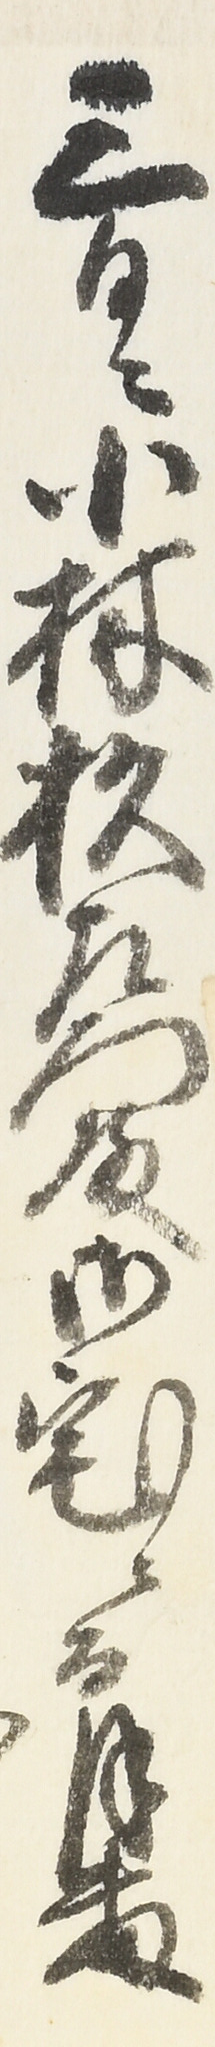三日ニ小林杉左衛門殿御宅ニ而月番
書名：御才覚金御利足割渡扣帳
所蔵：伊那市立高遠町図書館・合同会社AMANE
